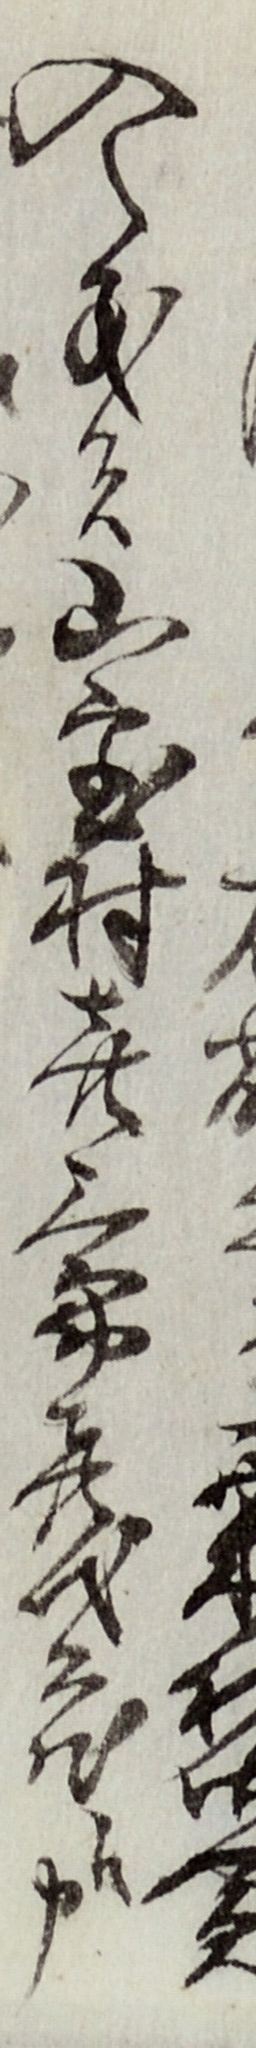入之義者山室村喜三郎喜代蔵江申

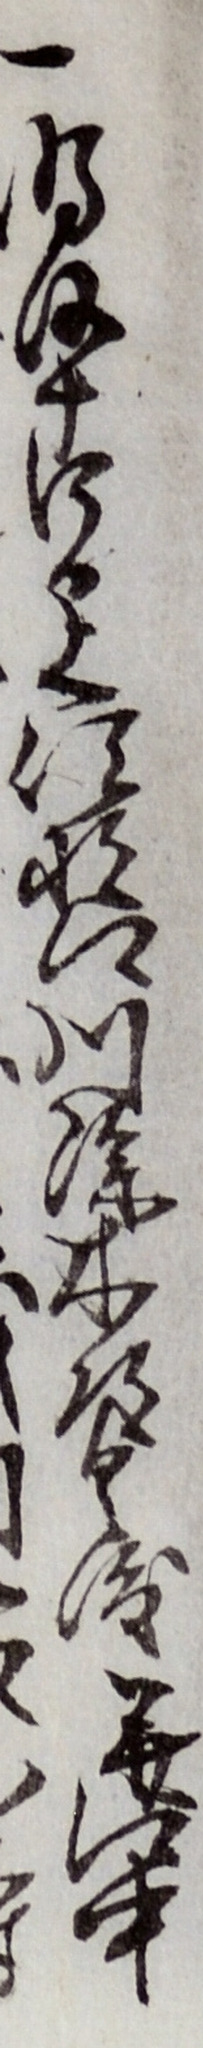一明後十四日上伊那郷川除木道具渡并郷中
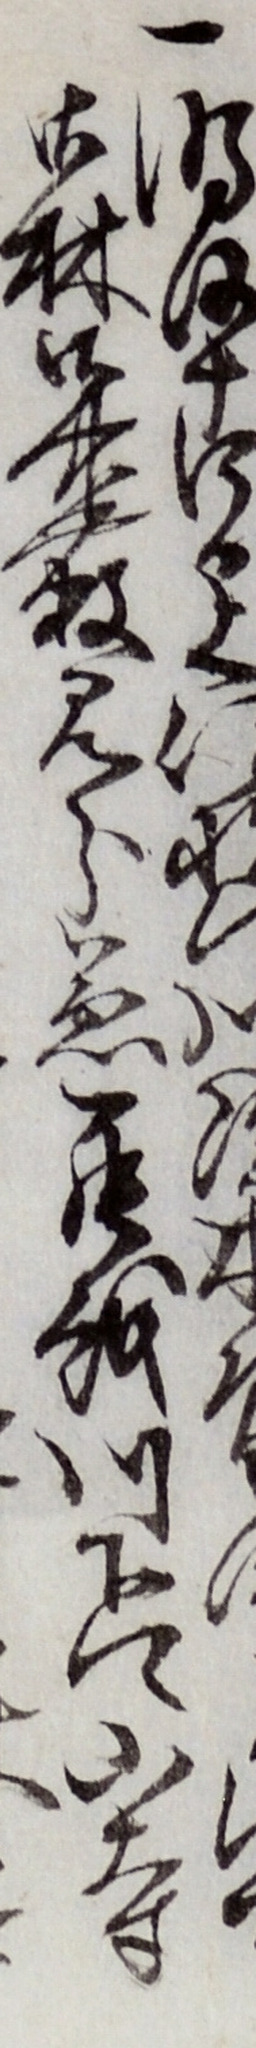御林御竹薮見分兼罷越川下郷山寺
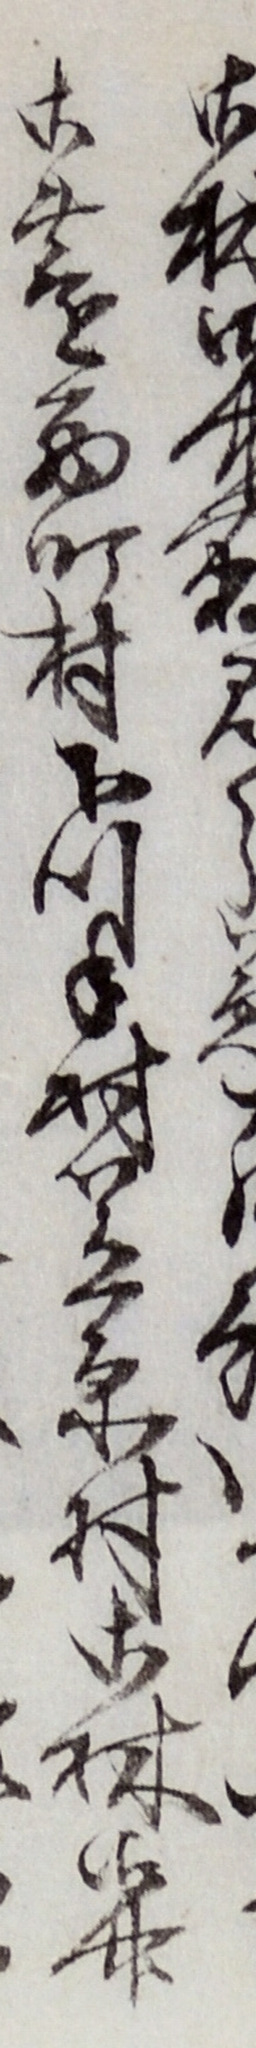御薗西町村下川手村笠原村御林御竹
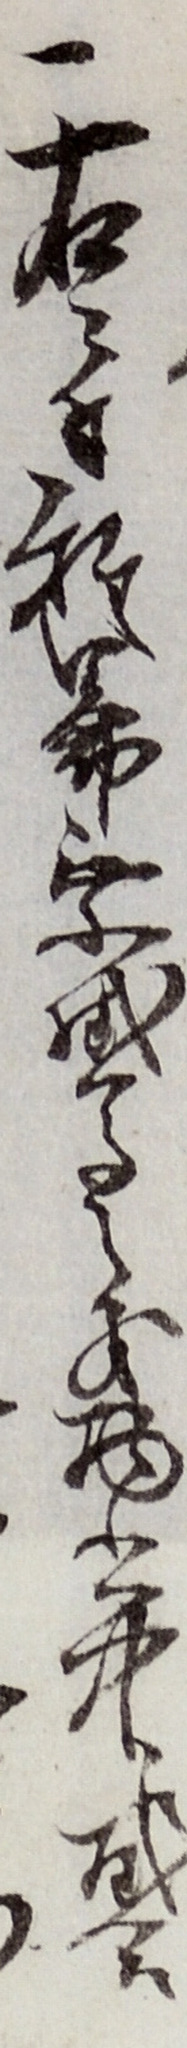一右ニ付雅四郎乗掛馬之義物書中へ掛合
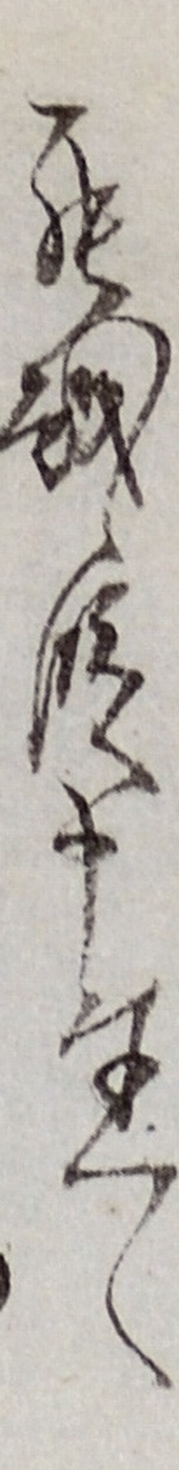罷越候段申達候
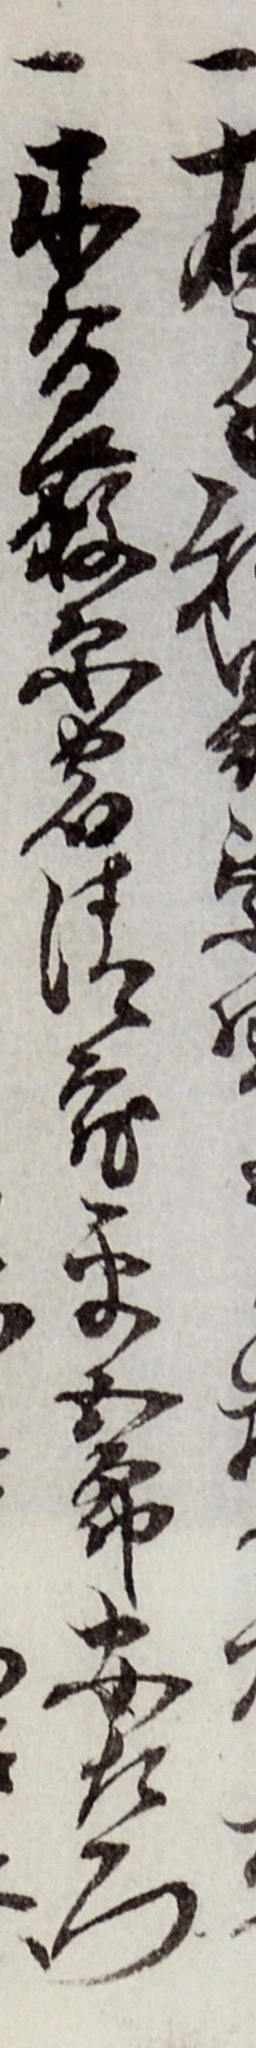一木曽薮原宿清蔵平五郎安左衛門
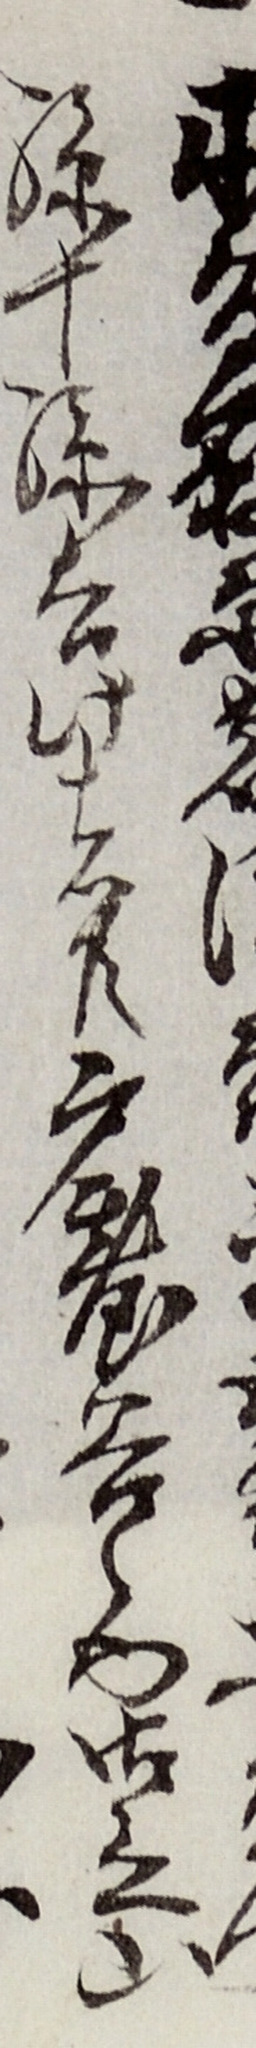孫十孫吉此者共戸台谷之内御立山
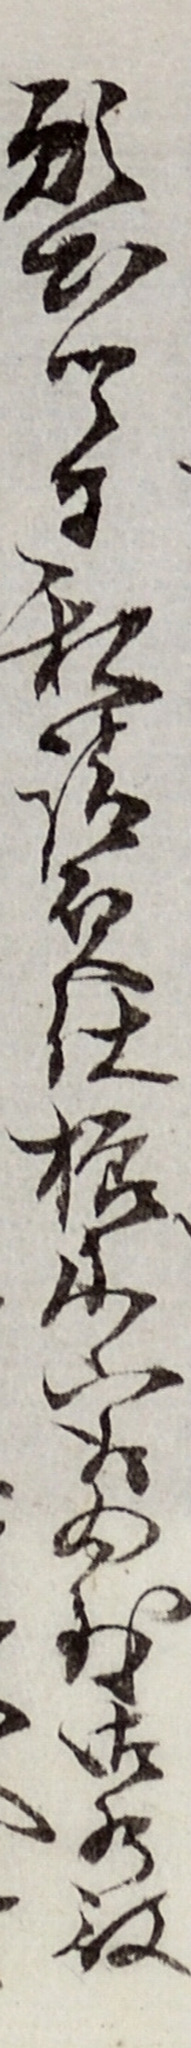願出候ニ付私請負仕櫛木山取為致御水役
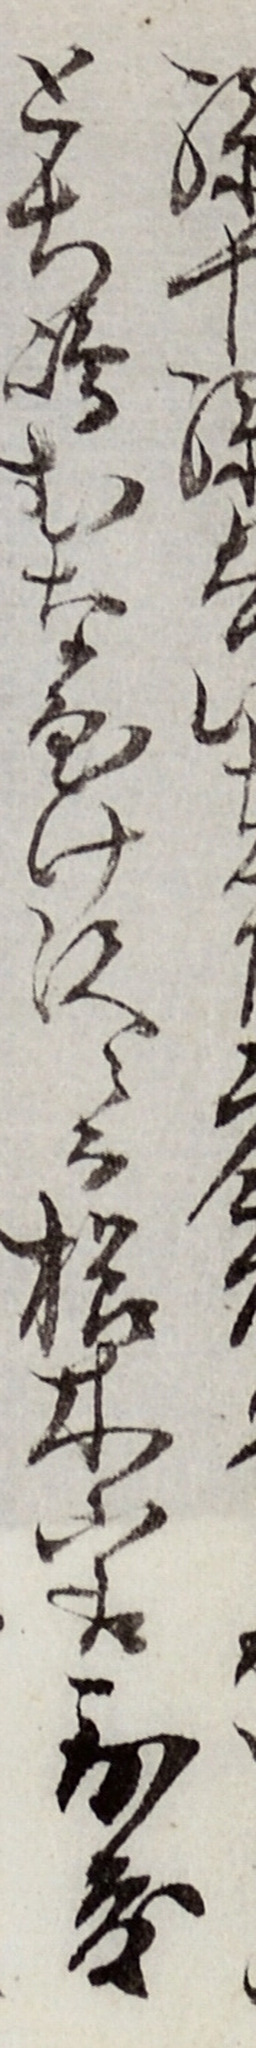とち嶋むなやけ沢ニ而櫛木山取致度
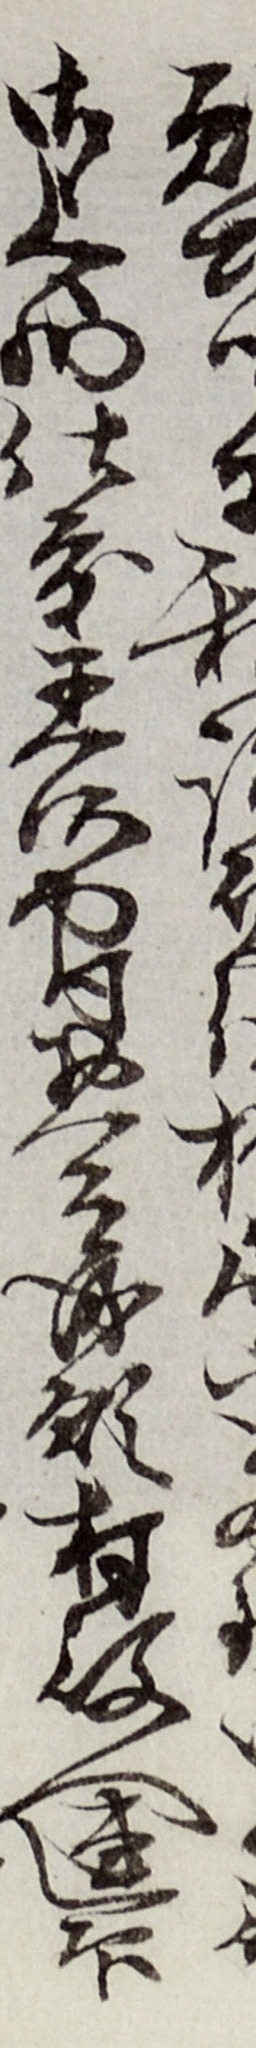御上納仕度黒河内村惣兵衛願村役人連印
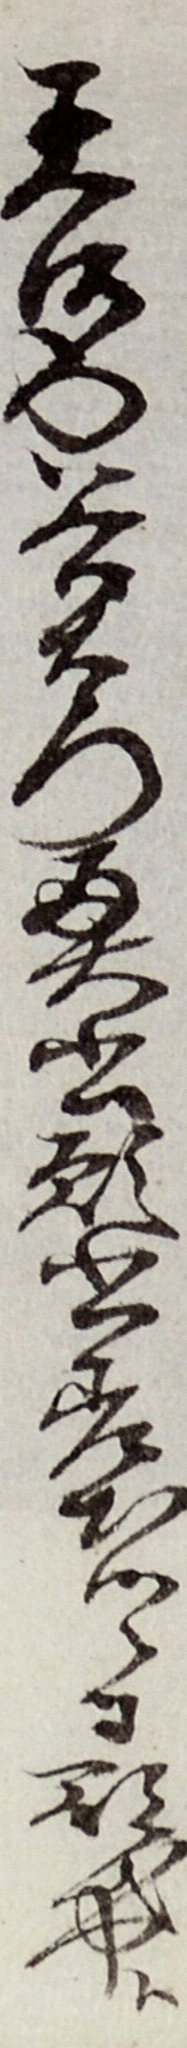黒河内谷右衛門奥書願書差出候ニ付郡代中江
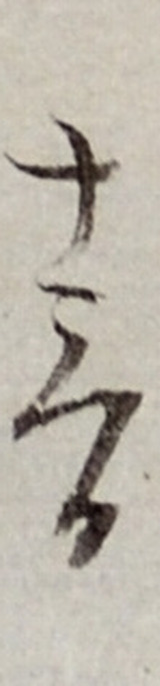十三日
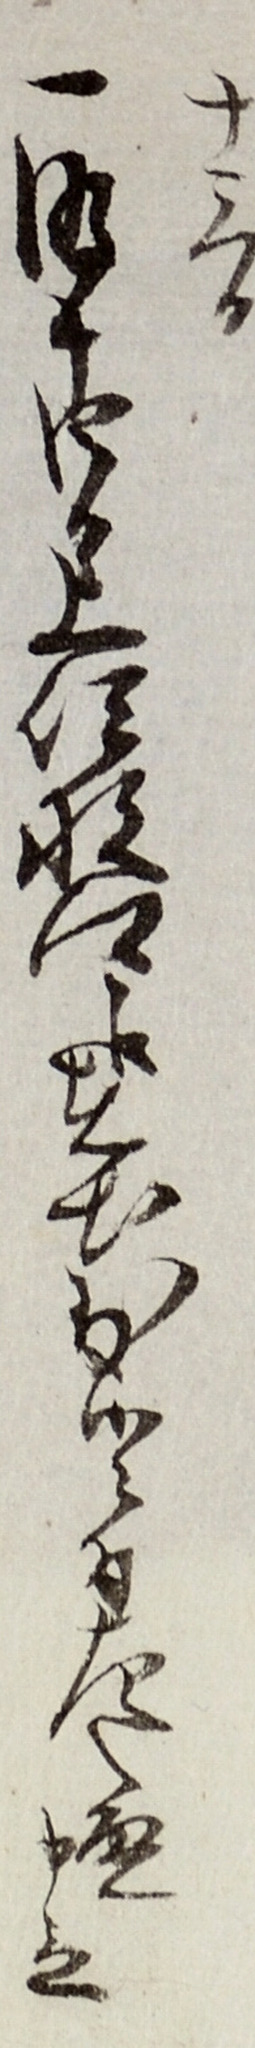一明十四日上伊那郷江在出致候ニ付左之通申立
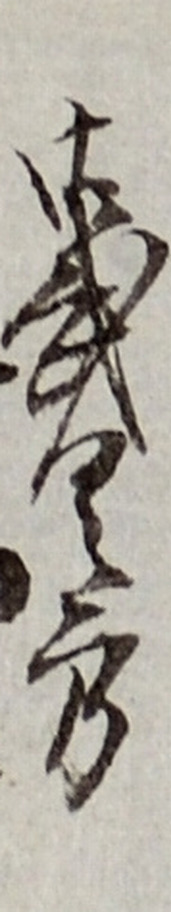御武具方
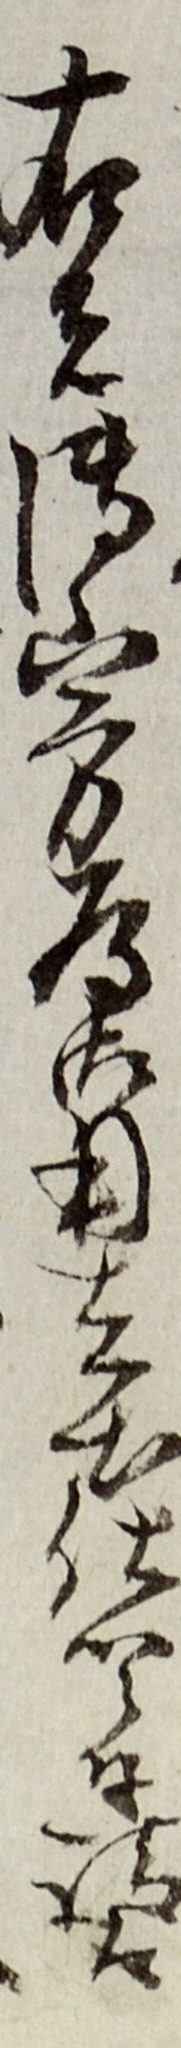右者御山方為御用在出仕候ニ付請取
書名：御山方御薪方諸事御用留
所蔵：伊那市立高遠町図書館・合同会社AMANE
